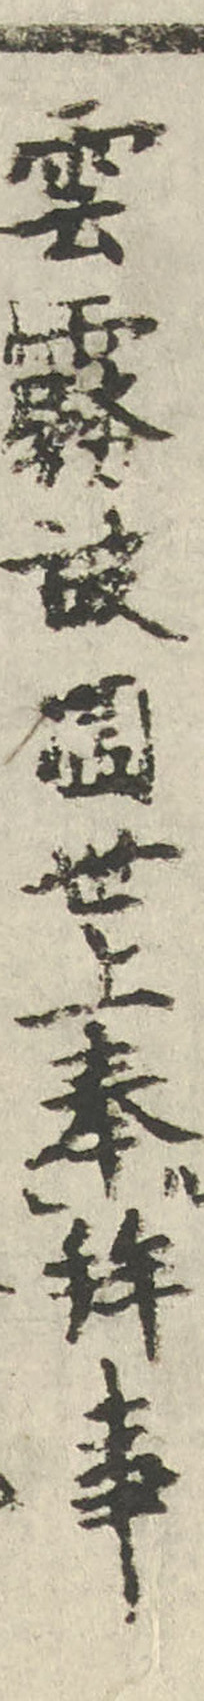雲霧被囲世上奉ル拝事
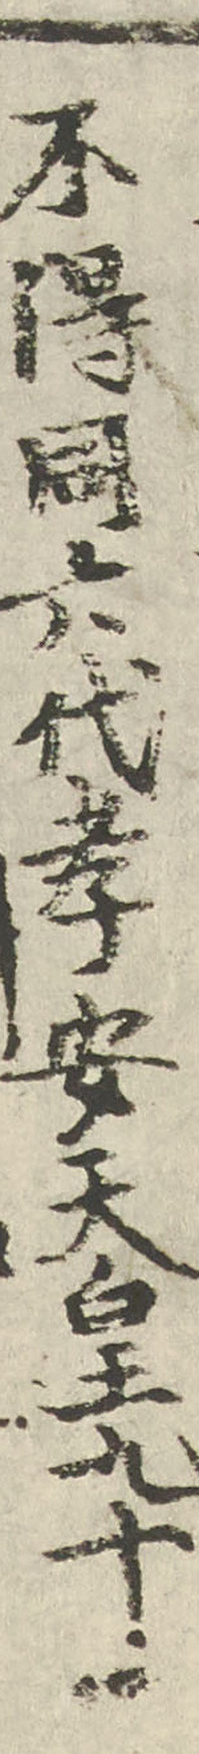不得同六代孝安天皇九十
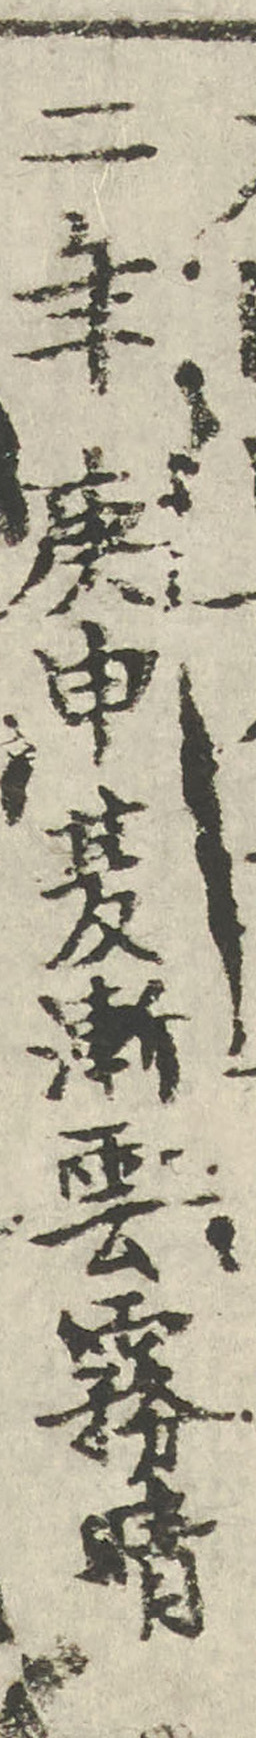二年庚申漸雲霧晴
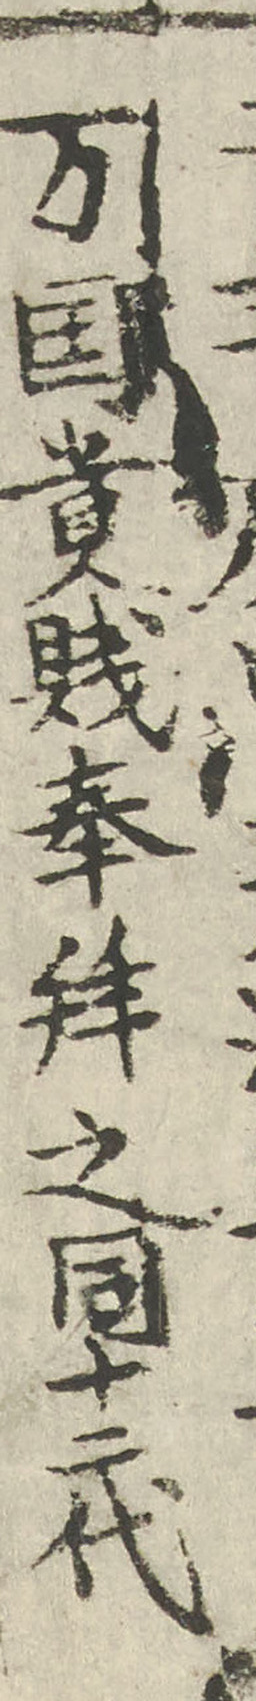万国貴賎奉拝之同十二代
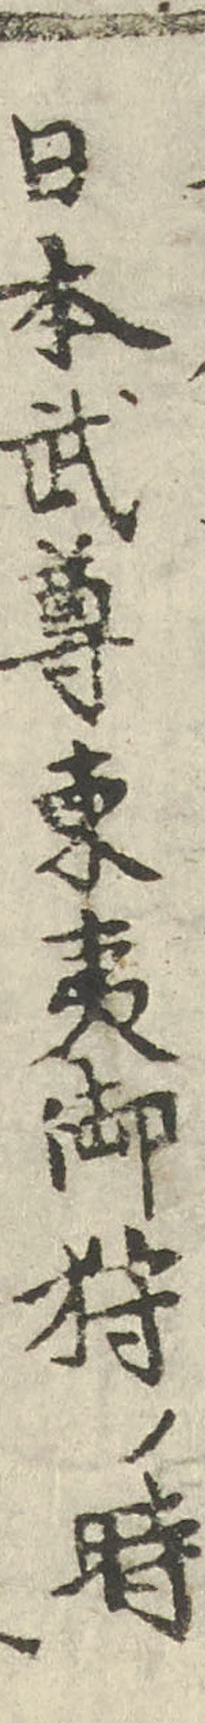日本武尊東夷御狩ノ時
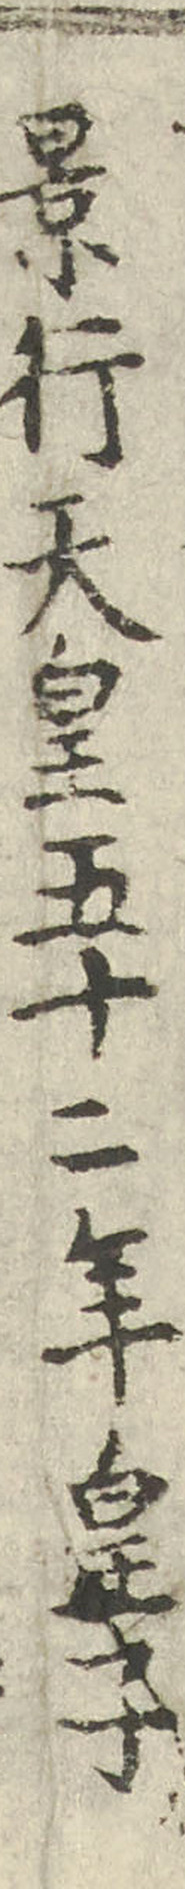景行天皇五十二年皇子
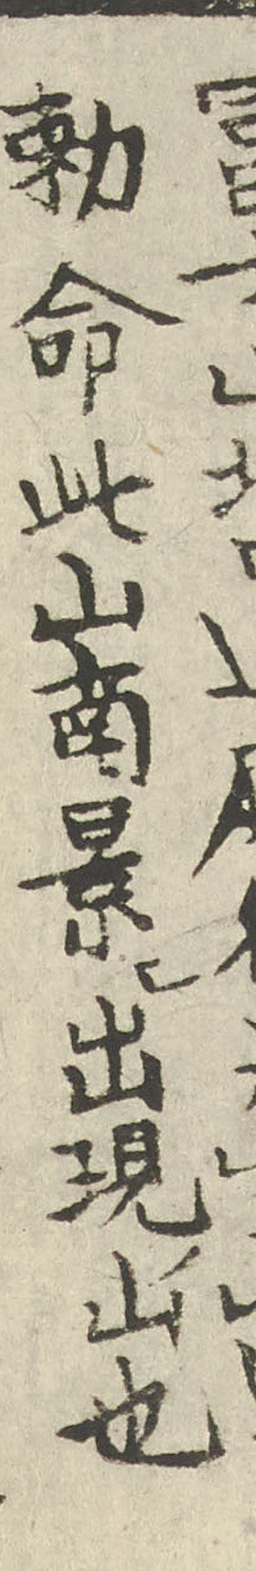勅命此山南景ニ出現ノ山也
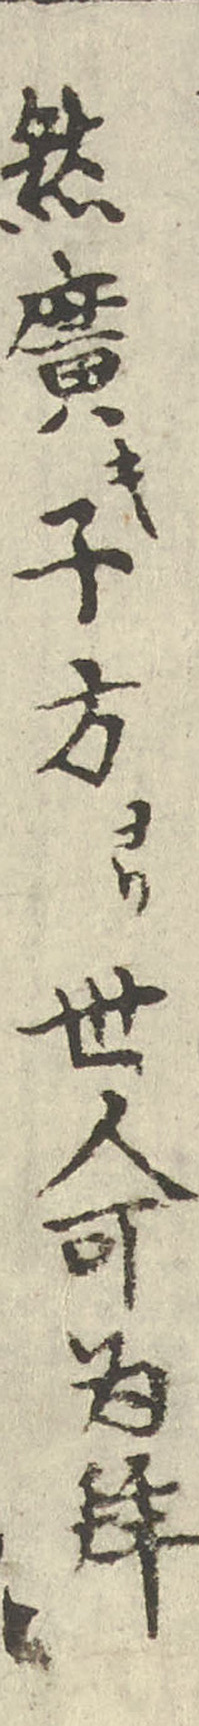然広キ子方ヨリ世人可為拝
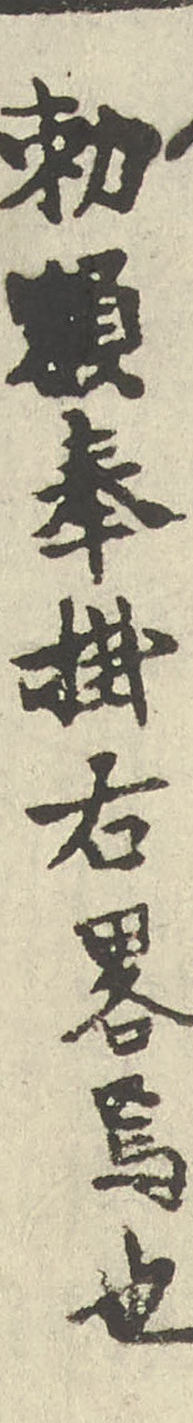勅額奉掛右畧焉也
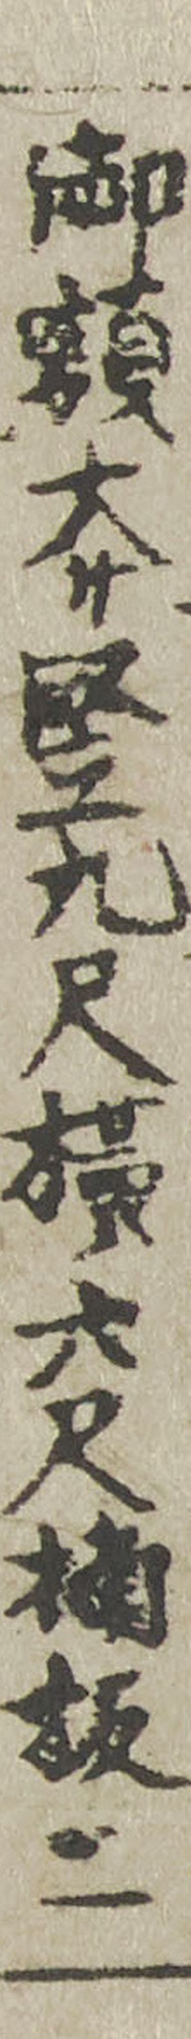御額大サ竪九尺横六尺楠板二
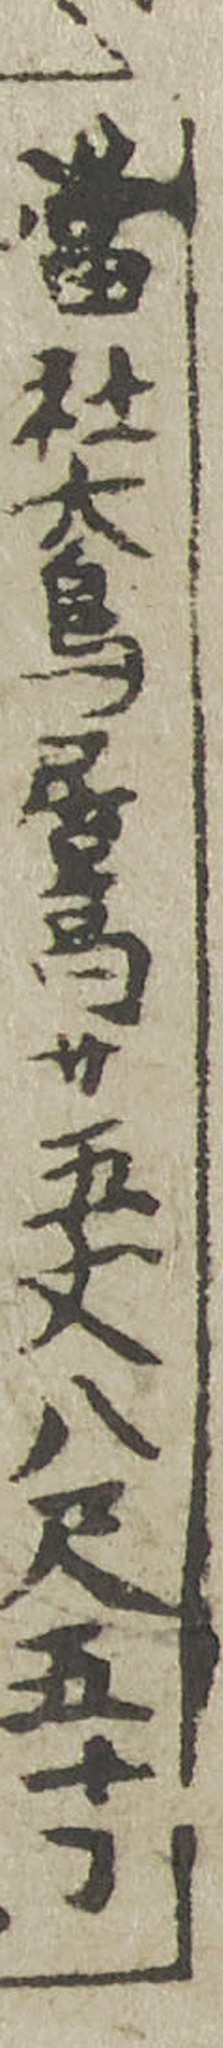当社大鳥居高サ五丈八尺五寸
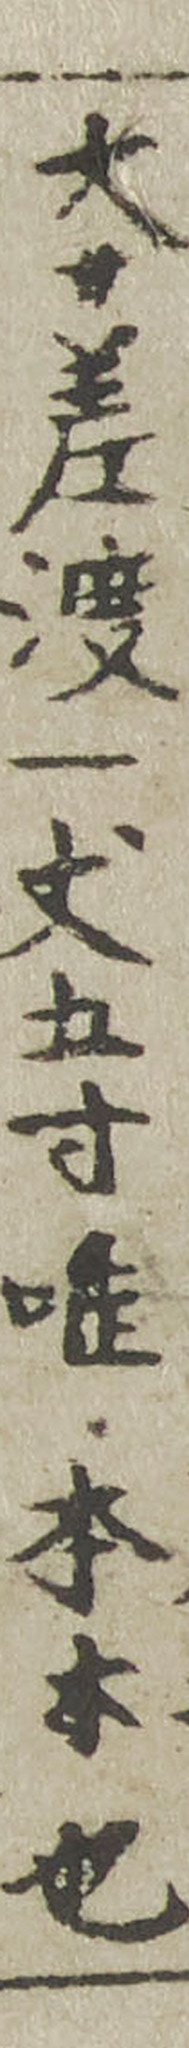大サ差渡一丈五寸唯本木也
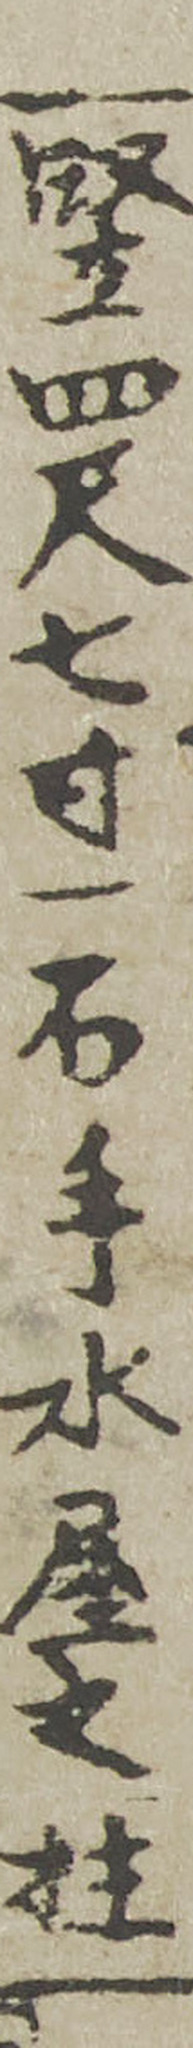竪四尺七寸一石手水屋之柱
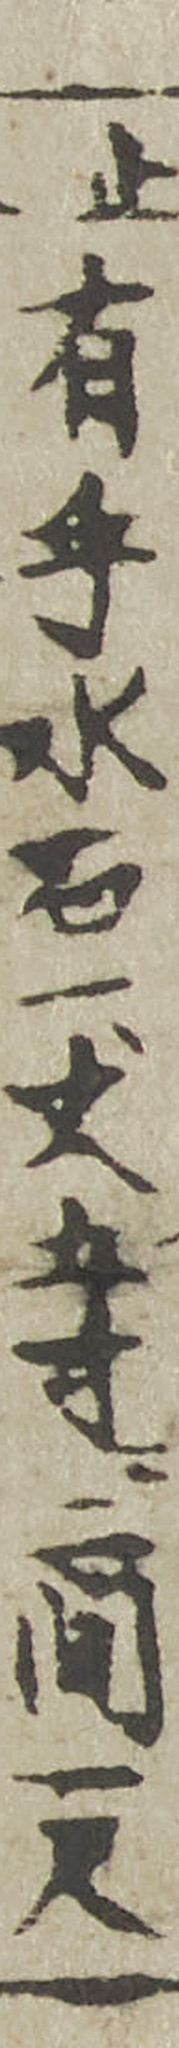止有手水石一丈五寸一間一尺
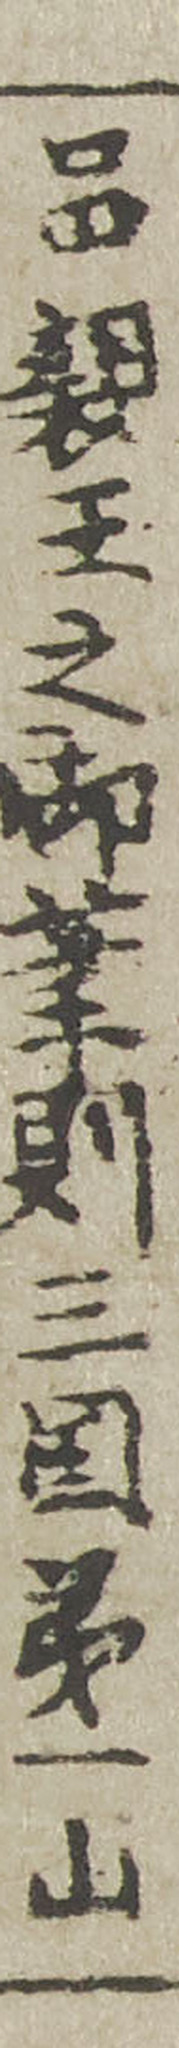品親王之御筆則三国第一山
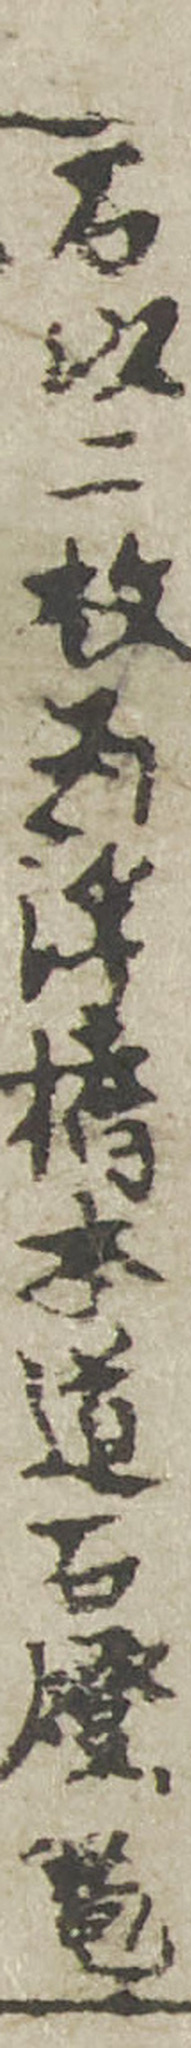石以二枚為浮橋本道石灯篭
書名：富士山神宮麓八海北口正面略絵図
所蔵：東京大学総合図書館 General Library in the University of Tokyo, JAPAN
